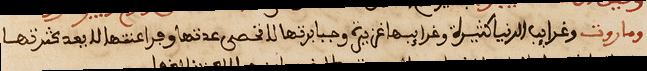وماروت وغرائب الدنيا كثيرة وغرائبها غزيرة وجبابرتها لا تحصى عدتها وفراعنتها لا يعد كثرتها
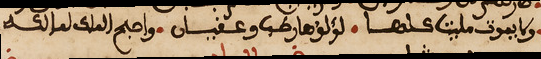ولا بيوت مليت كلها لؤلؤها رطب وعقيان واصبح الملك لمالكه
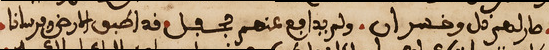صار لهم ذل وخمسران ولم يدافع عنهم مجفل قد اطبق الارض وفرسانا
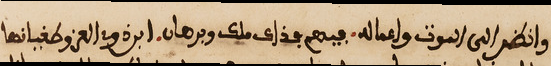وانظر الى الموت واعماله فيهم فذاك ملك وبرهان اين ذوى العز وطغيانها
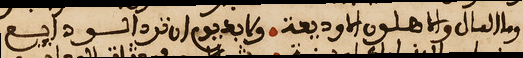وما المال والاهلون الا وديعة ولا بد يوم ان ترد الودائع
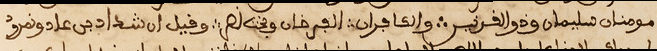مومنان سليمان وذو القرنين والكافران الفرخان وبخت نصر وقيل ان سداد بن عاد ونمرود
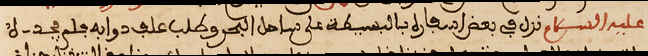عليه السلام نزل في بعض اسفاره بالبسيطة على ساحل البحر وطلب علف دوابه فلم يجده
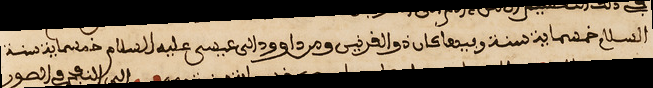السلام خمسماية سنة وفيها كان ذو القرنين ومن داو الى عيسى عليه السلام خمسماية سنة
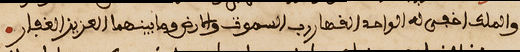والملك اخفى له الواحد القهار رب السموت والارض وما بينهما العزيز الغفار
